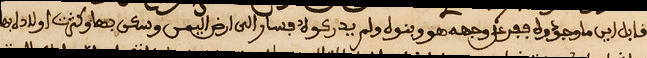قابل اين ما وجدوه ففر على وجهه هو بنوه ولم يدركوه فسار الى ارض اليمن وسكن بها وكثرت اولاده بها
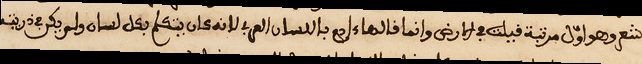شعر وهو اوّل مرتبة قيلت في الارض وانما قالها ءادم باللسان العربى لانه يتكلم بكل لسان ولم يكن في ذرريته
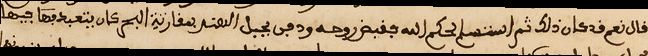قال نعم قدد كان ذلك ثم استسلم لحكم الله فقبض روحه ودفن بجبل الهند بمغارته التي كان يتعبد بها فيها
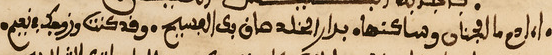اءام ما الجنان وساكنها بدار الخل صاق بك الفسيح وقد كنت زوجك في نعيم
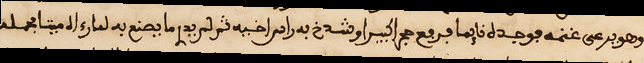وهو يرعى غنمه فوجده نائما فرفع حجا كبيرا وشرخ به راس اخيه ثم لم يدرى ما يصنع به لما رءاه ميتا فحمله
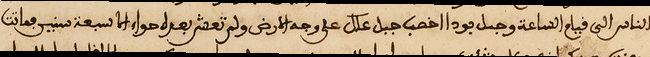الناس الى قيام الساعة وحبل بودا اخصب جبل علك على وجه الارض ولم تعش بعده حواء الا سبعة سنين فماتت
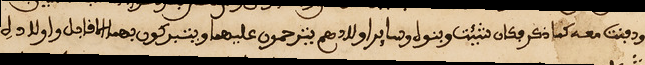ودفنت معه كما ذكر فكان شيئت وبنوه وسائر اولاهم يترحمون عليهما ويتبركون بهما الا قابل واولادهِ
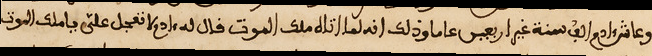وعاش ءادم الف سنة غير اربعين عاما وذلك انه لما اتاه ملك الموت قال له ءادم لا تعجل علىّ يا ملك الموت
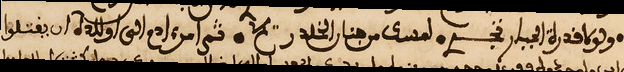ولو ولا قدرة الجبار تجرى لمسك من جنان الخلد ريح ثم امر ءادم الى اولاده ان يقتلوا
